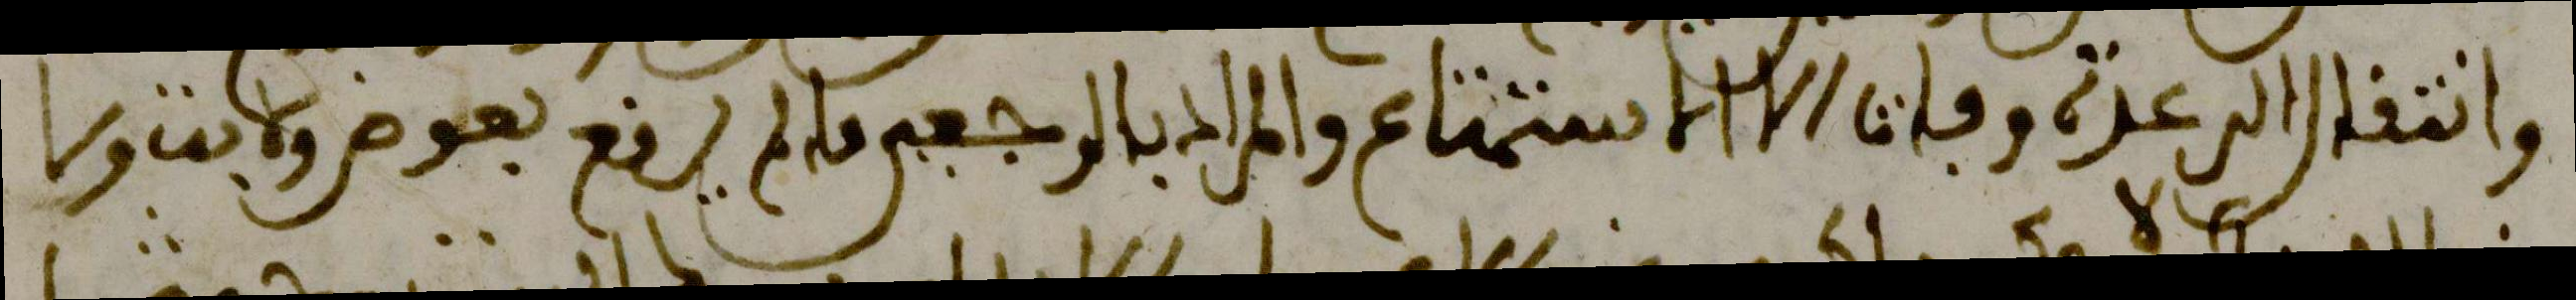و انتقال الى عدة وفات الا الاستمتاع و المراد بالرجعي ما لم يرفع بعوض و لابت و لا
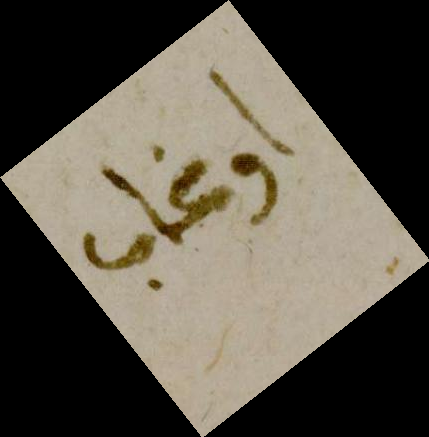او غاب
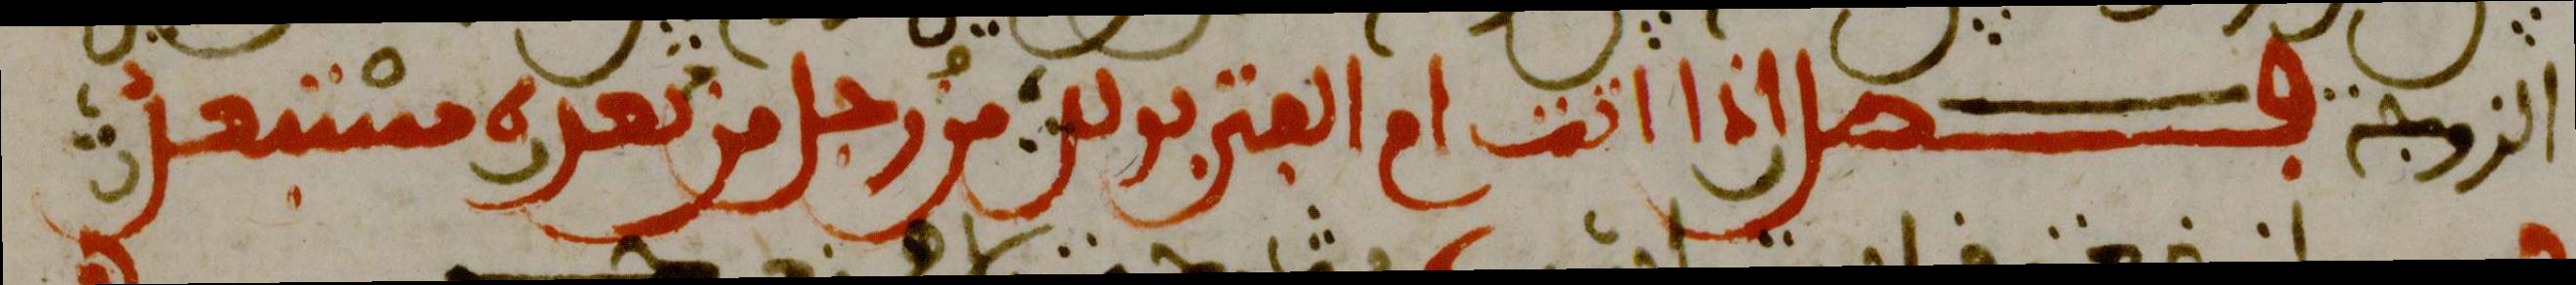الزوجة فصل اذا اتت ام الفتى بولد من رجل من بعده مستبعد
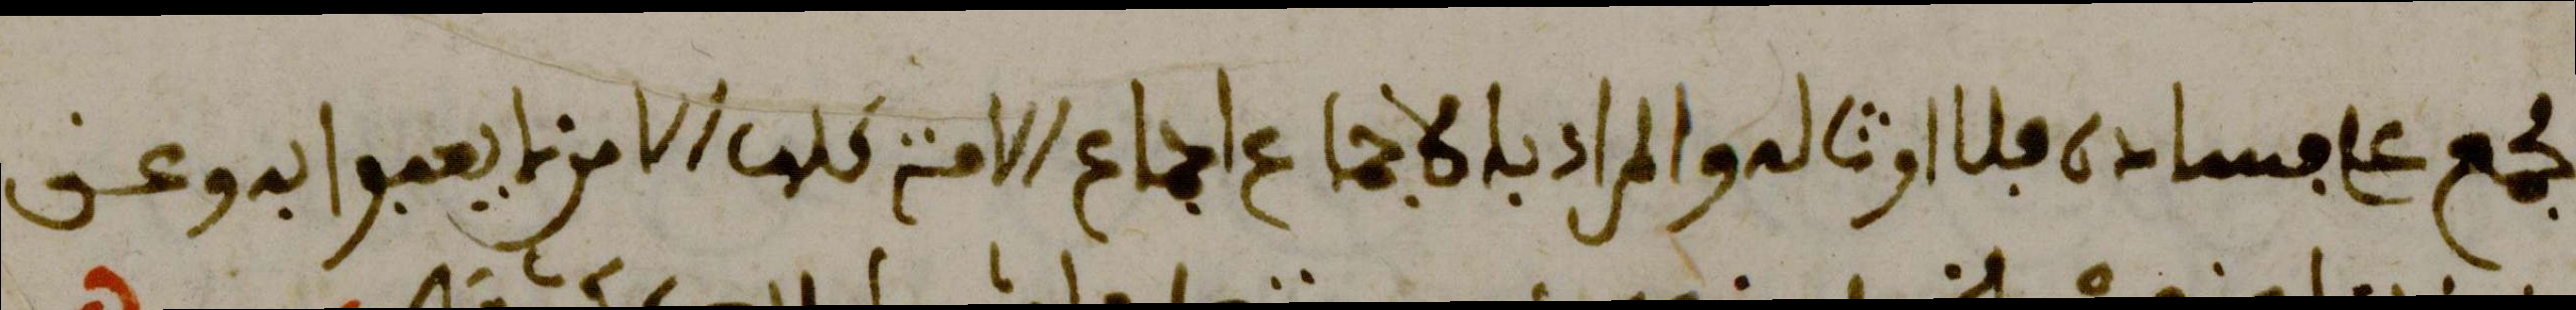مجمع على فساده فلا ارث له و المراد بالاجماع اجماع الامة كلها الا من لا يعبوا به و عن
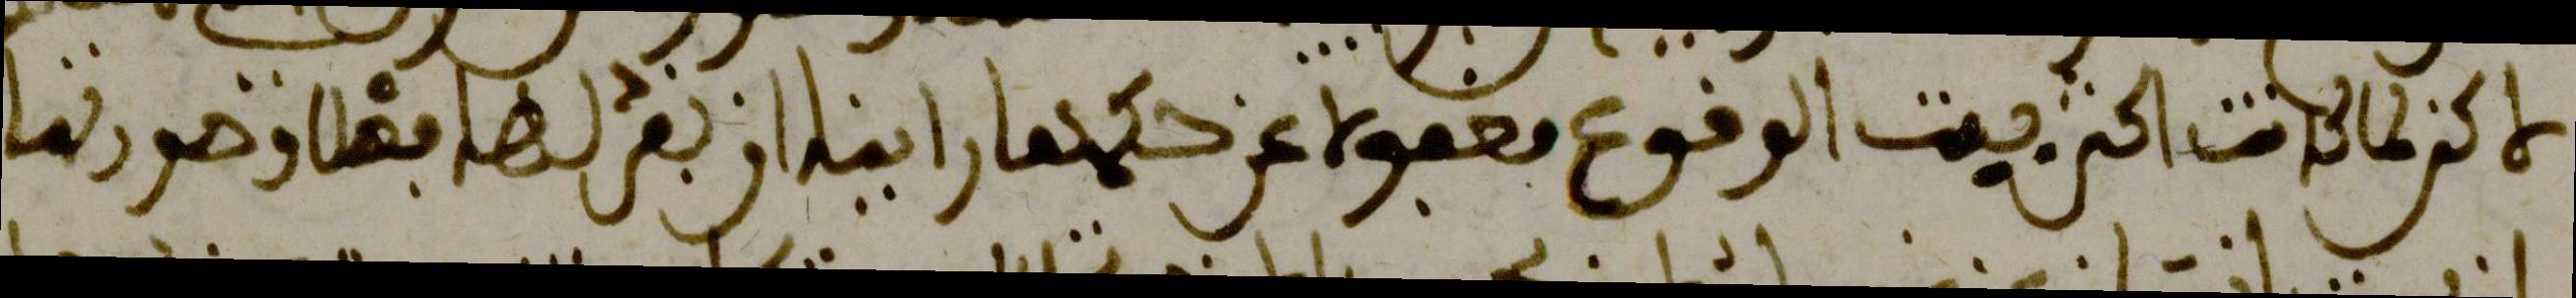لاكن لما كانت اكثرية الوقوع مغفولا عن حكمها راينا ان نفرد لها فصلا و صورتها
